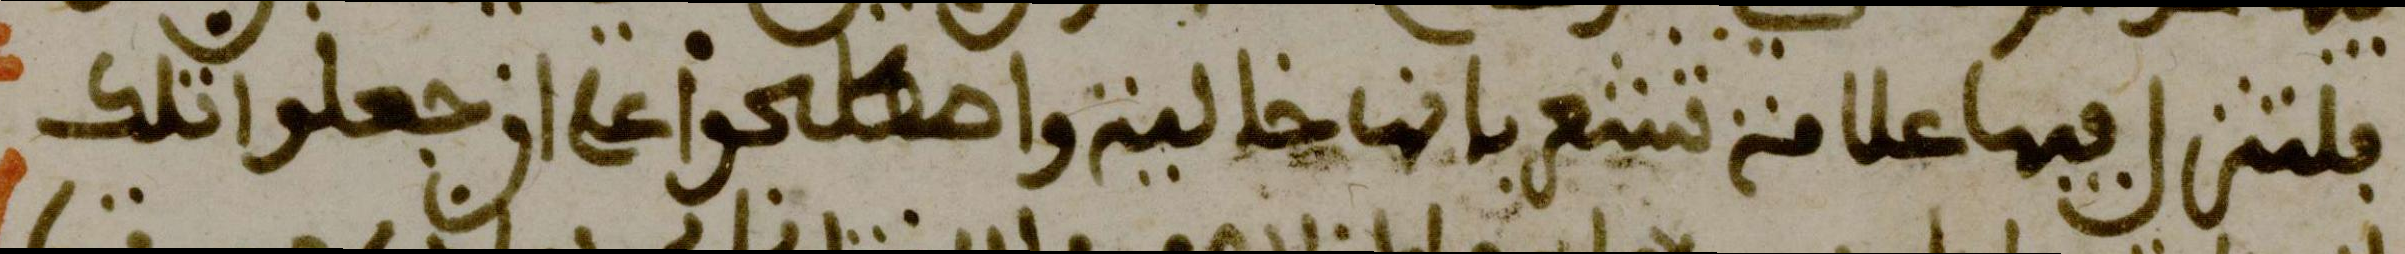فلتنزل فيها علامة تشعر بانها خالية واصطلحوا على ان جعلوا تلك
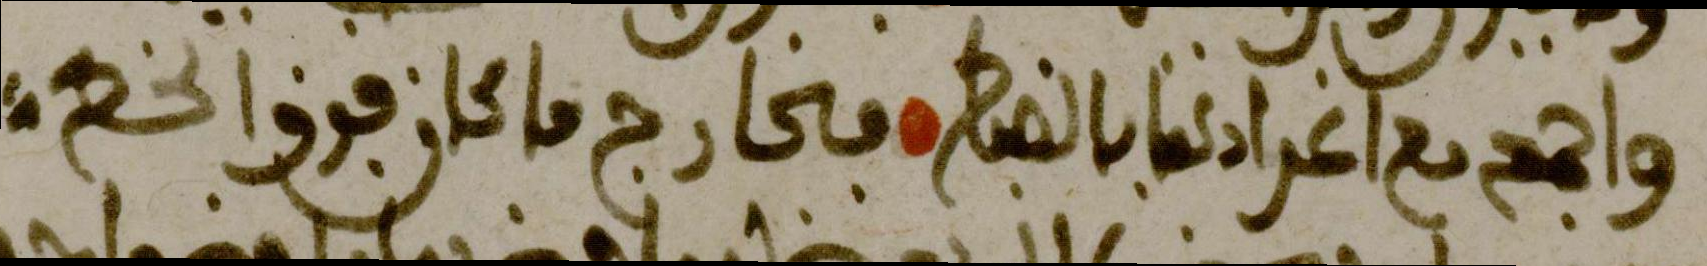واجمعه مع اعدادها بالضبط فخارج ما كان فوق الخط
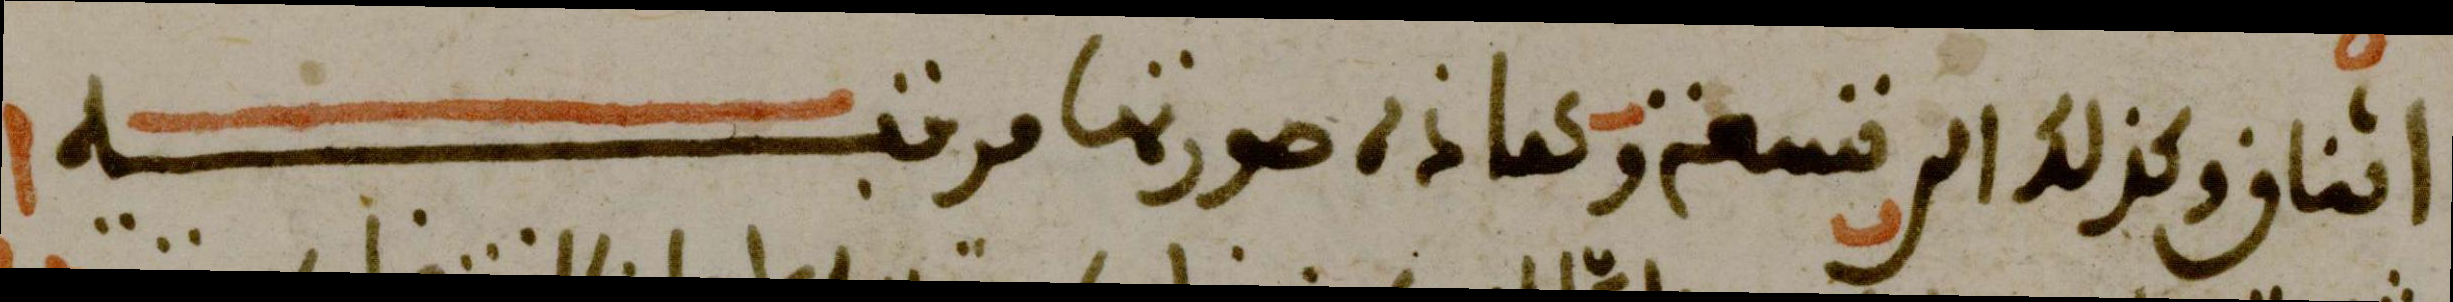اثنان وكذلك الى تسعة وهاذه صورتها مرتبه
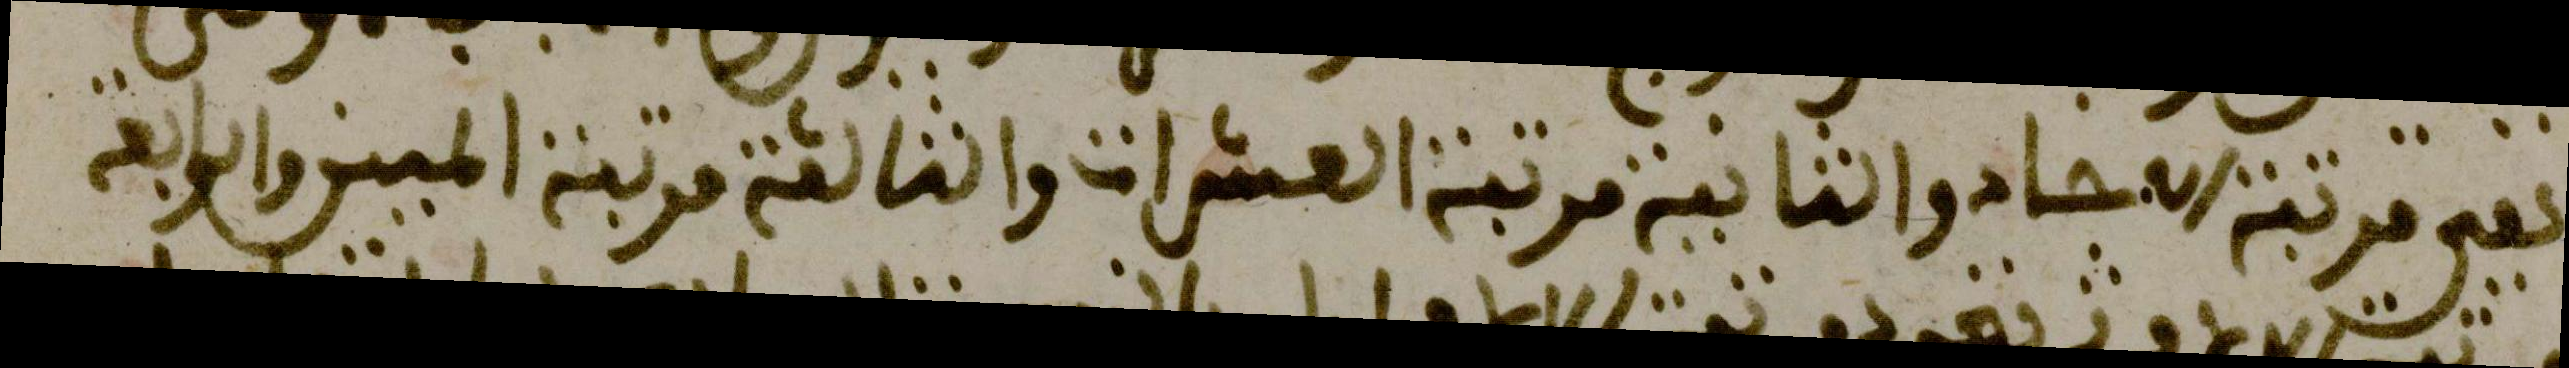هي مرتبة الاحاد والثانية مرتبة العشرات والثالثة مرتبة الميين الرابعة
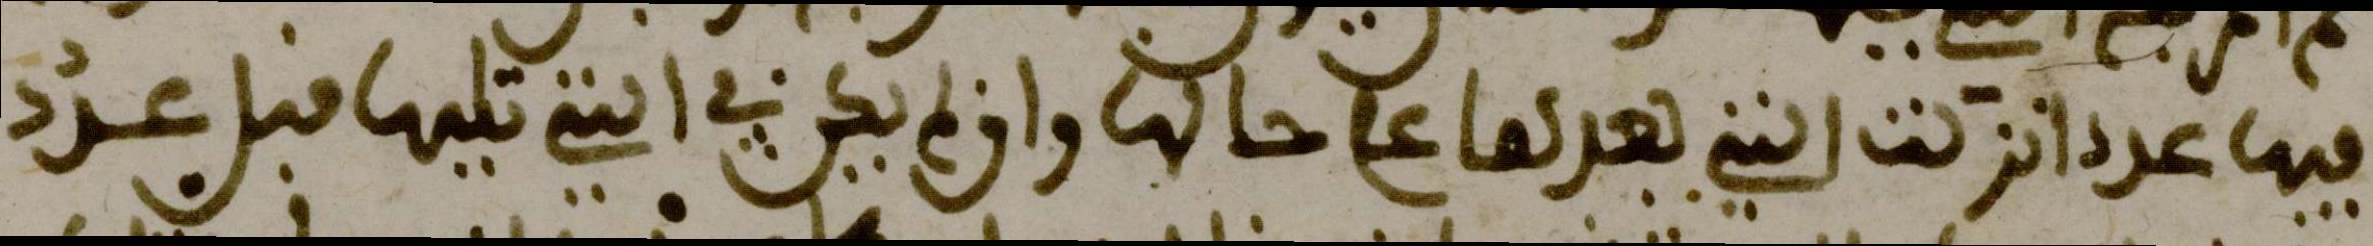فيها عدد انزلت التي بعدها على حالها وان لم يكن في التي تليها قبل عدد
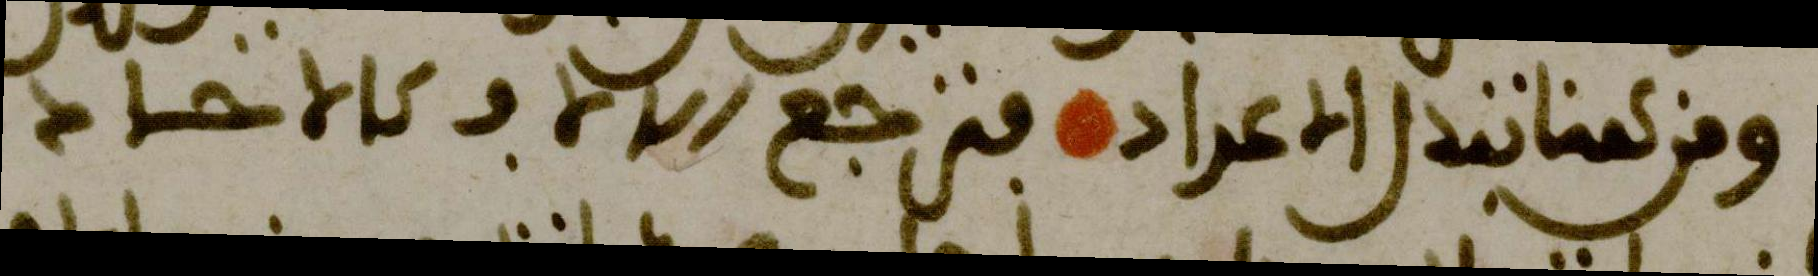ومن هنا تبدل الاعداد فترجع الالاف كالاحاد
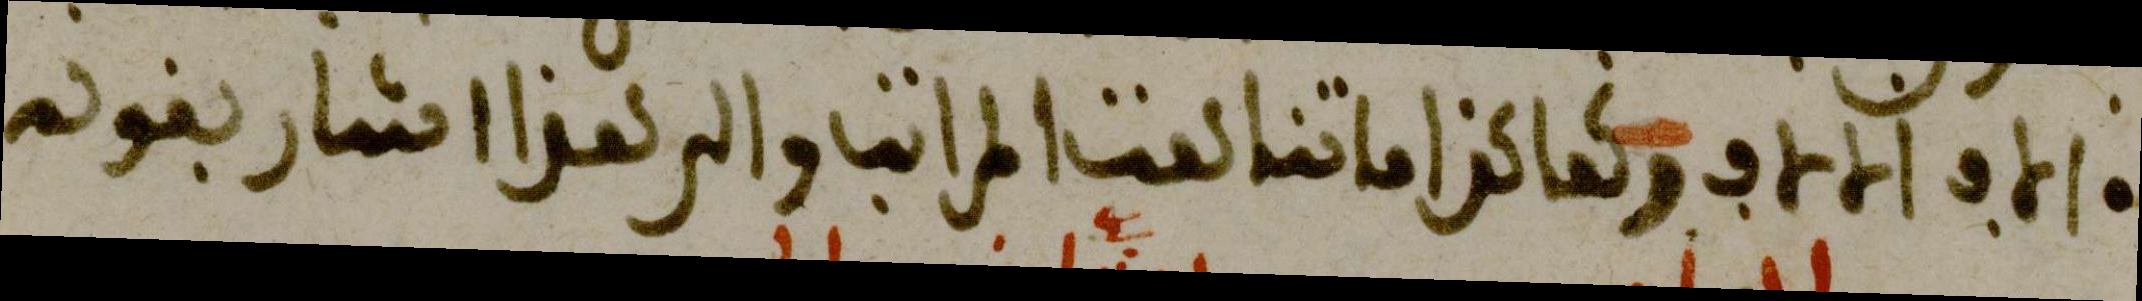ءالاف الالاف وهاكذا ما تباهت المراتب والى هذا اشار بقوله
